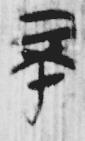不
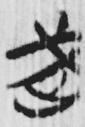武
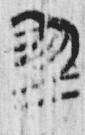則（則）
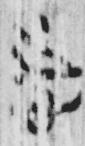志
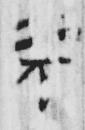不
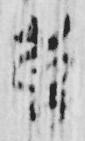○（仁）
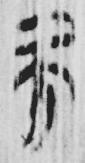而
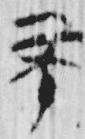不
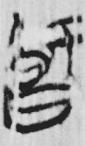智
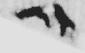○（則）
